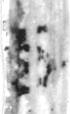西
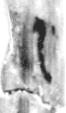北
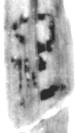見
